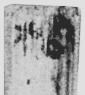相
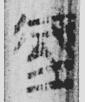𫊟（乎）
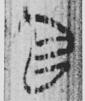官
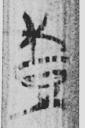梪（樹）
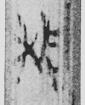桐
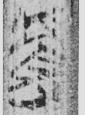虘B（且）
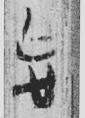{㠯心}（治）
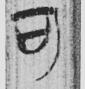可（兮）
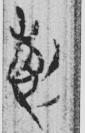{叀刀}（摶）
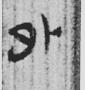外
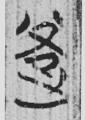{罒疋}（疏）
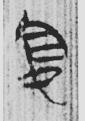{宀𠁩}（中）
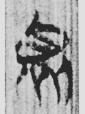眾
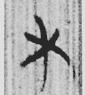木
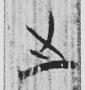之
